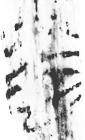○（奎）
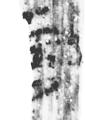丙
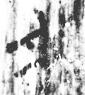才（在）
